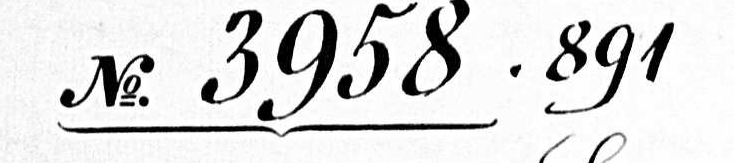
No. 3958 - 1891
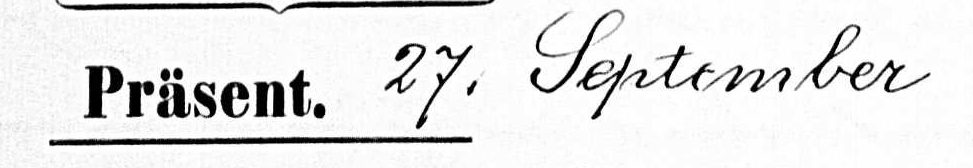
Präsent. 27. September
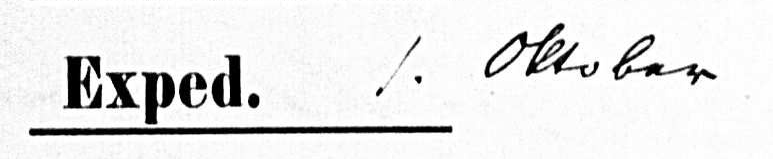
Exped. 1. Oktober
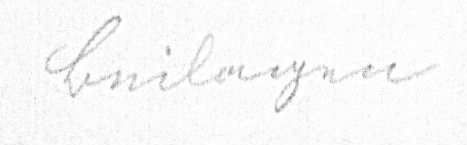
Beilagen
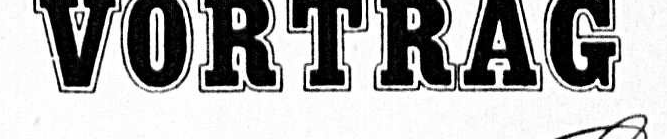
VORTRAG
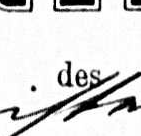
des
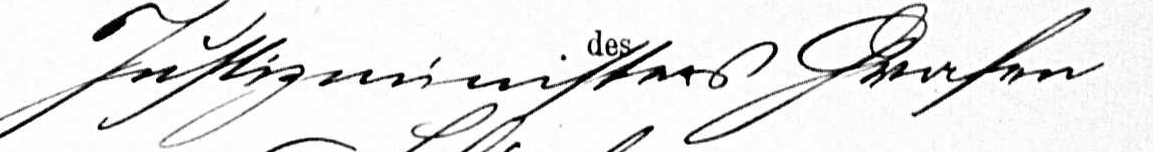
Justizministeriums Grafen
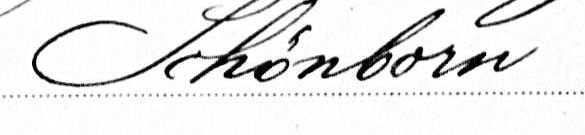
Schönborn
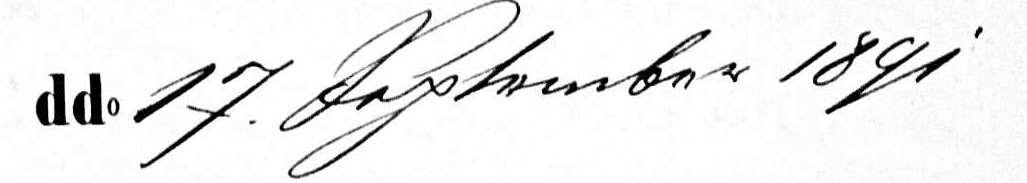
ddo 17. September 1891
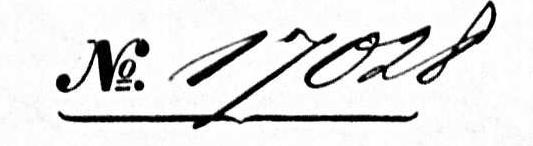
No. 17028
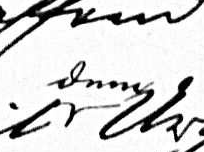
dem
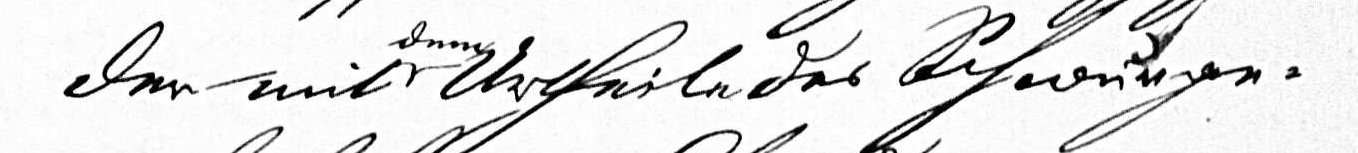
der mit Urtheile des Schwurge¬
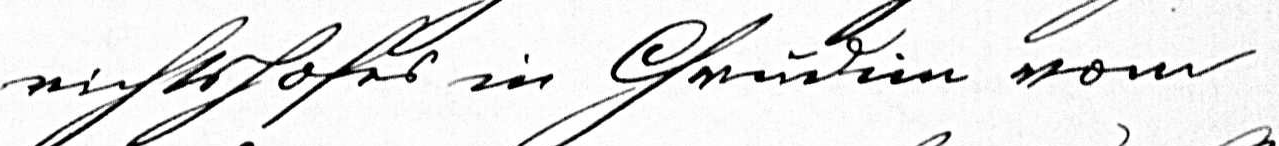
richtshofes in Chrudim vom
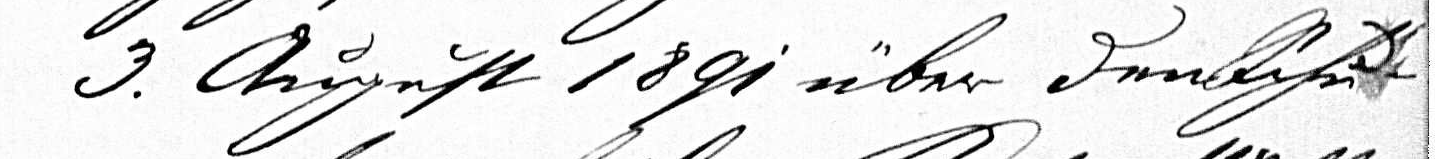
3. August 1891 über den Schuh¬
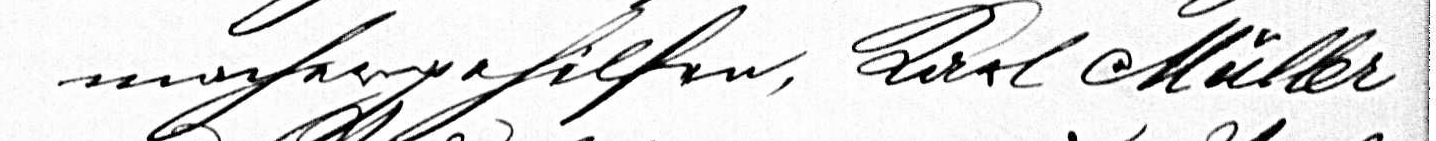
machergehilfen, Karl Müller
